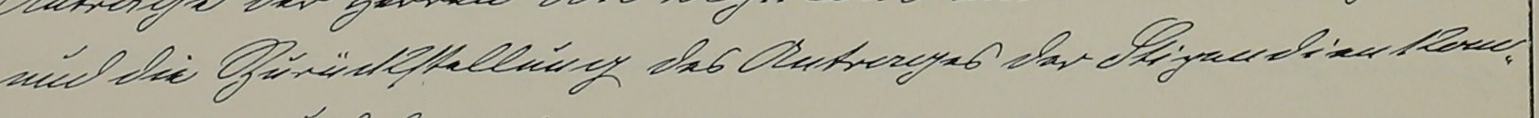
und die Zurückstellung des Antrages der Stipendienkom-
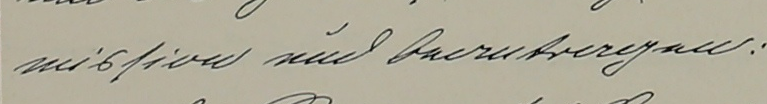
mission und beantragen:
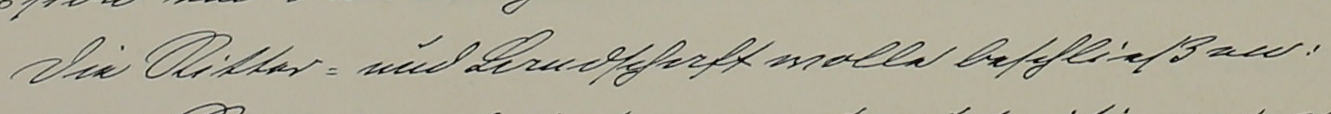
Die Ritter- und Landschaft wolle beschließen:
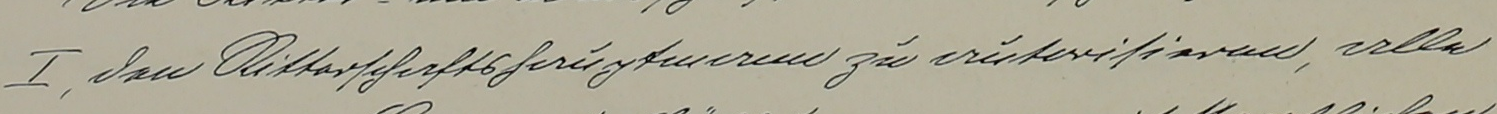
I. den Ritterschaftshauptmann zu autorisieren, alle
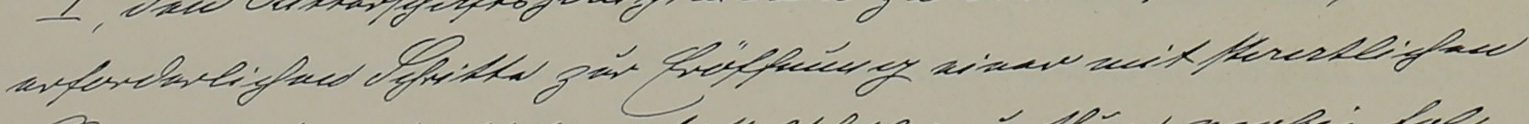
erforderlichen Schritte zur Eröffnung einer mit staatlichen
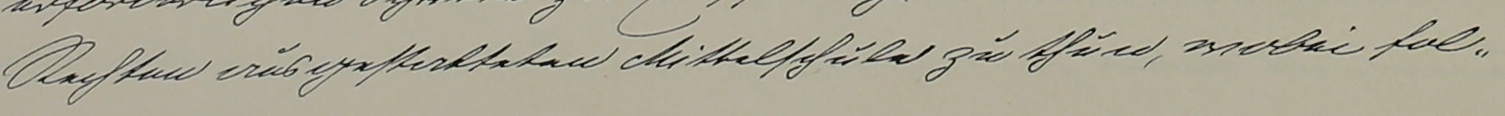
Rechten ausgestatteten Mittelschule zu thun, wobei fol-
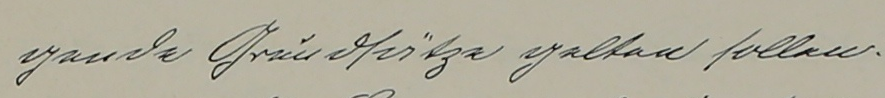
gende Grundsätze gelten sollen:
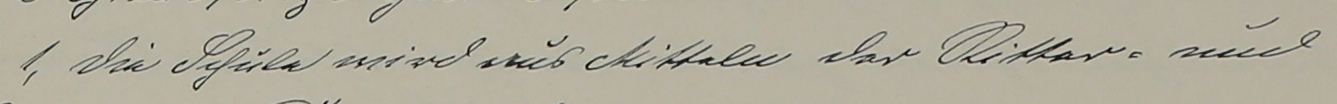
1. Die Schule wird aus Mitteln der Ritter- und
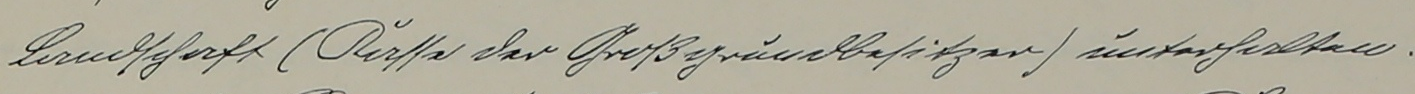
Landschaft (Kasse der Großgrundbesitzer) unterhalten.
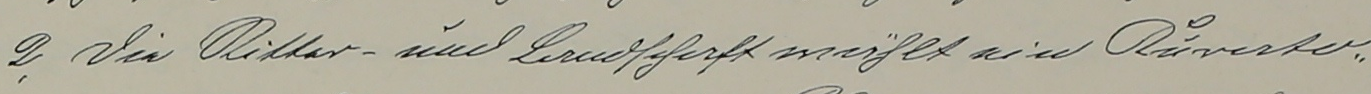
2. Die Ritter- und Landschaft wählt ein Kurato-
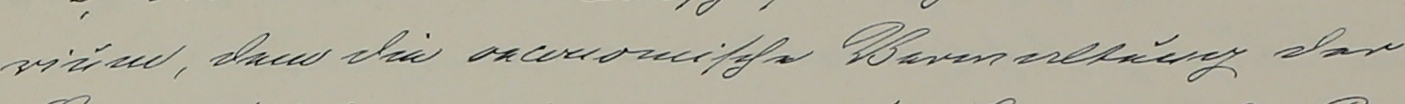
rium, dem die oeconomische Verwaltung der
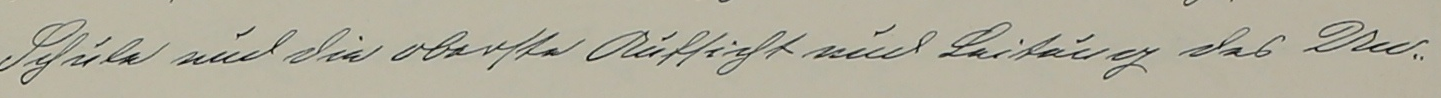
Schule und die oberste Aufsicht und Leitung des Un-
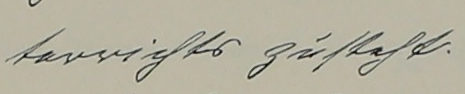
terrichts zusteht.
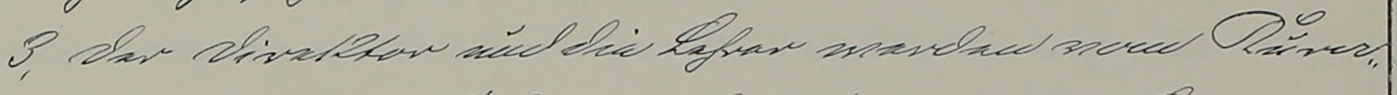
3. Der Direktor und die Lehrer werden vom Kura-
